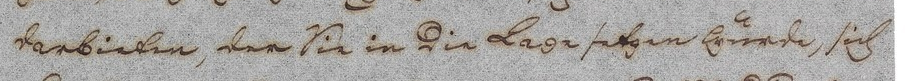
darbieten, der Sie in die Lage setzen würde, sich
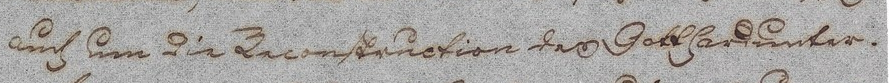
auch um die Reconstruction des Gotthardunter-
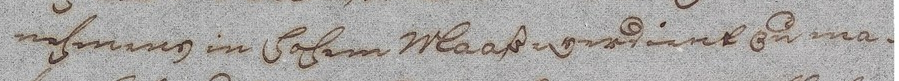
nehmens in hohem Maaße verdient zu ma-
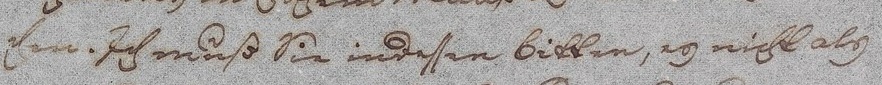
chen. Ich muß Sie indessen bitten, es nicht als
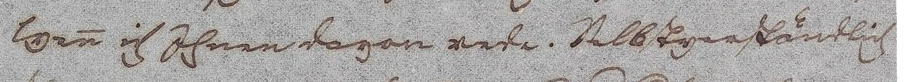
wenn ich Ihnen davon rede. Selbstverständlich
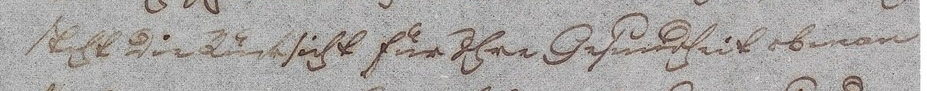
steht die Rücksicht für Ihre Gesundheit obenan
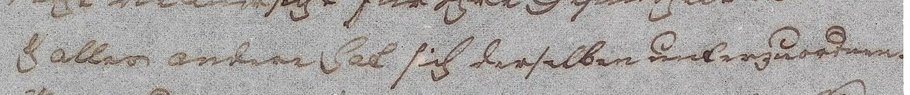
& alles andere hat sich derselben unterzuordnen.
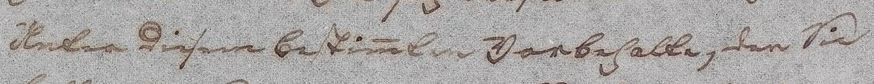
Unter diesem bestimmten Vorbehalte, den Sie
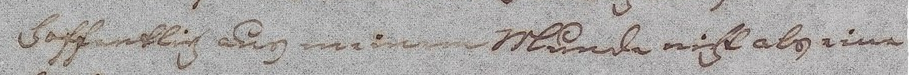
hoffentlich aus meinem Munde nicht als eine
